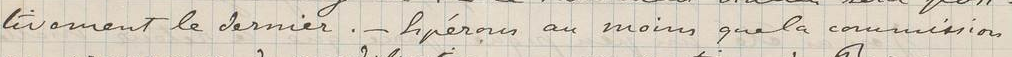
tivement le dernier. – Espérons au moins que la commission
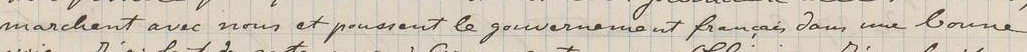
marchent avec nous et poussent le gouvernement français dans une bonne
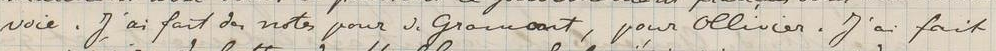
voie. J'ai fait des notes pour de Gramont, pour Ollivier. J'ai fait
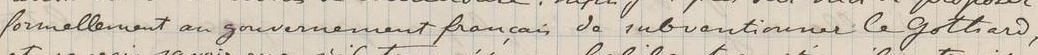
formellement au gouvernement français de subventionner le Gothard,
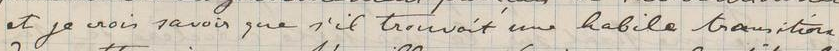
et je crois savoir que s'il trouvait une habile transition
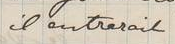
il entrerait
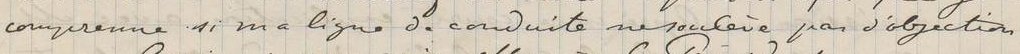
comprenne si ma ligne de conduite ne soulève pas d'objection.
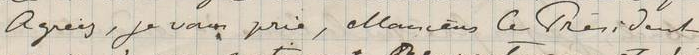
Agréez, je vous prie, Monsieur le Président,
